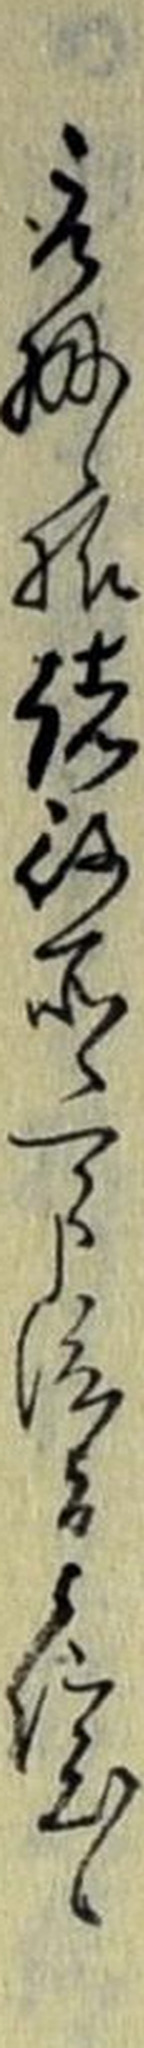取扱候様諸役所へ可申渡旨被仰出候
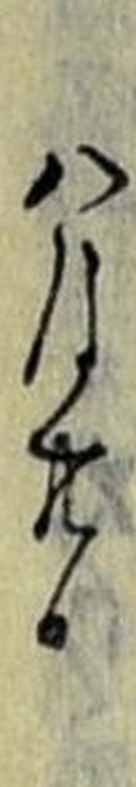八月廿日
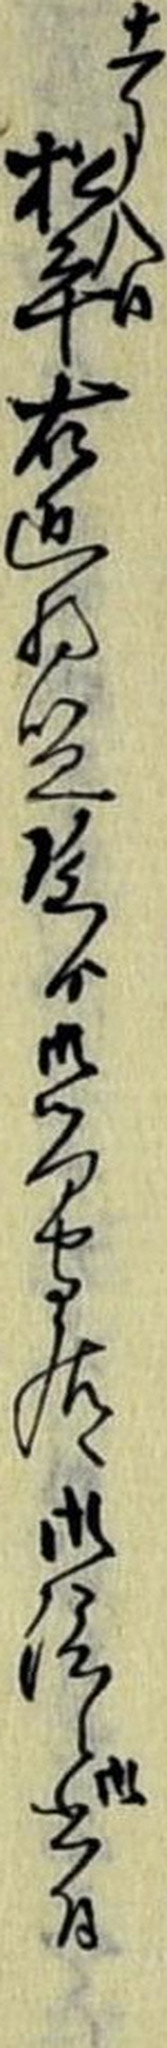松平右近将監殿ゟ御留守居へ御渡候御書付
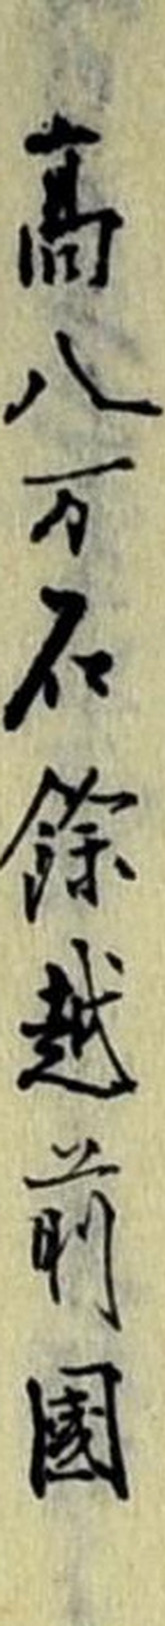高八万石余越前国
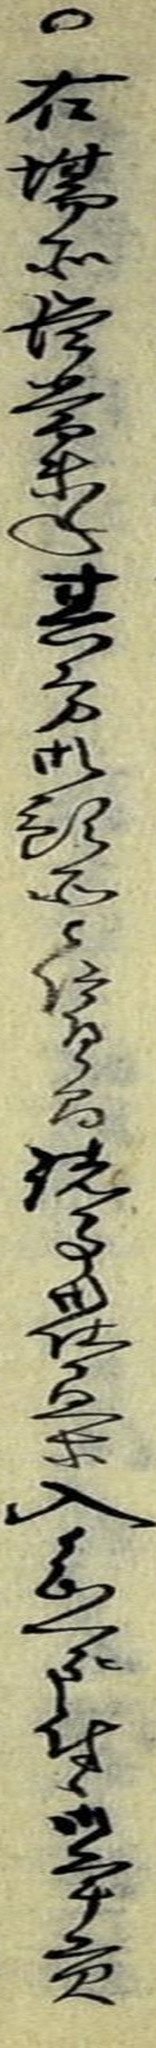〇右場所従当未年其方御預所被仰付候間諸事御仕置等入念可被申付候御年貢
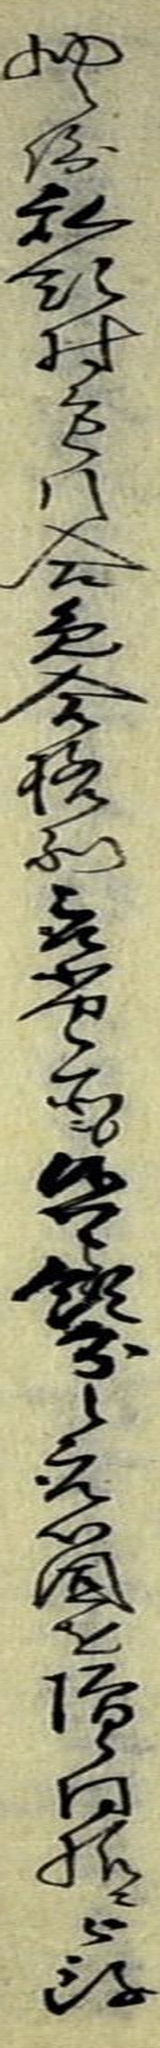納之儀私領村方へ引合免合格別取劣候所も候はゝ領分之取箇を増し同様に被致
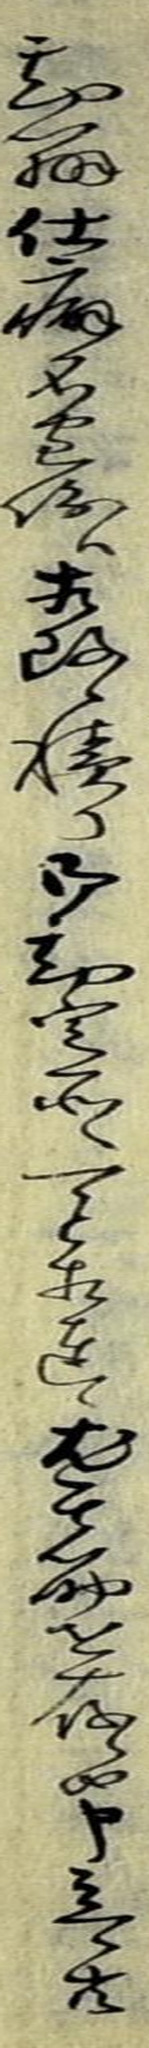勘弁仕病不宜儀は相改候積り御勘定所へ可被相達候尤其筋を存候由申立候共
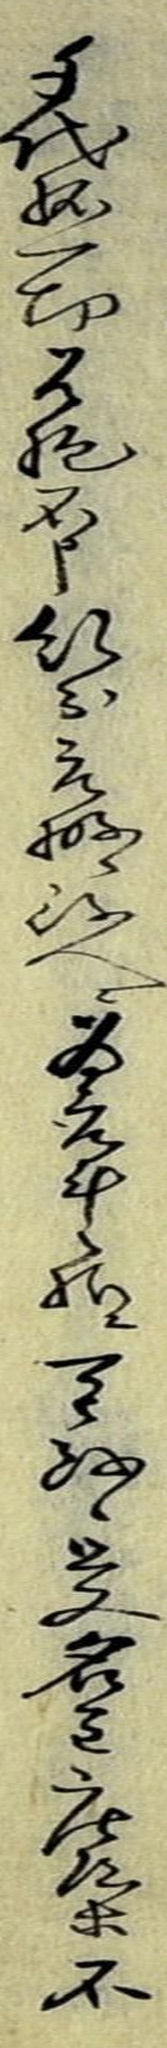手代抔一切召抱不申領分取扱候役人に為取斗候様に可被致候且又名主庄屋等不
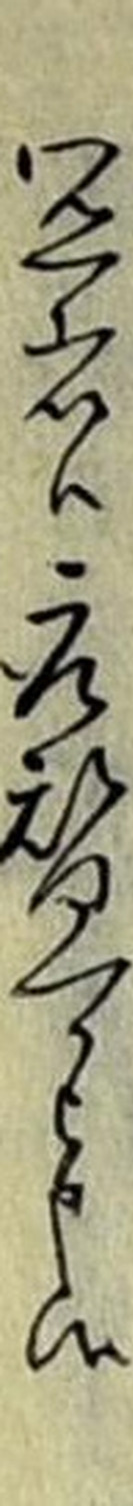宜者は取替可被申候
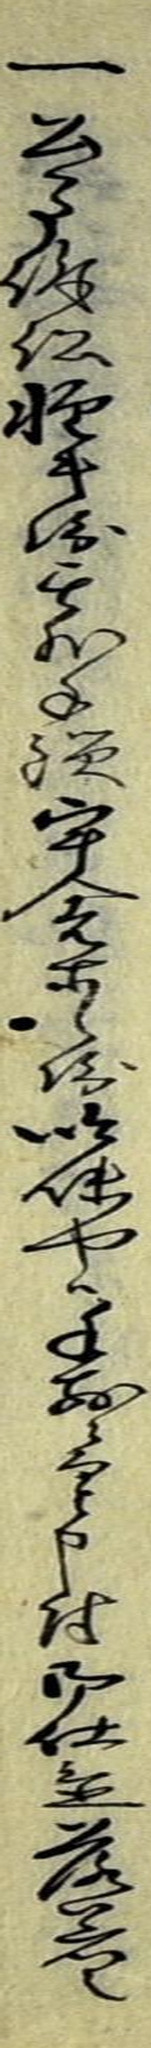一公事訴訟軽キ儀其外手鎖牢舎等之儀吟味中は手前に而被申付御仕置落着之
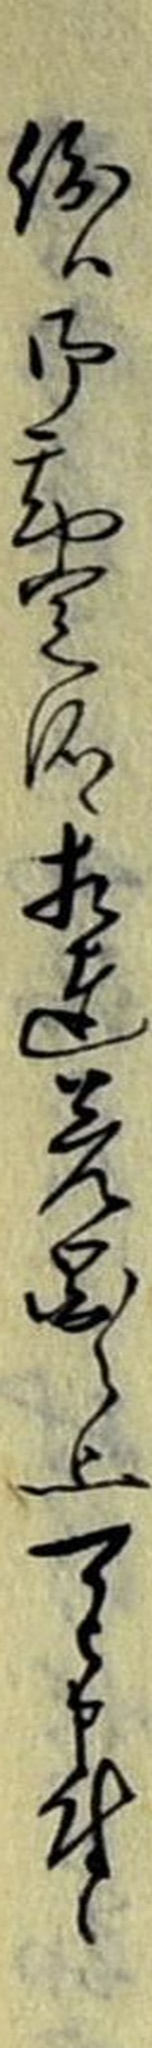儀は御勘定所へ相達差図之上可被申付候

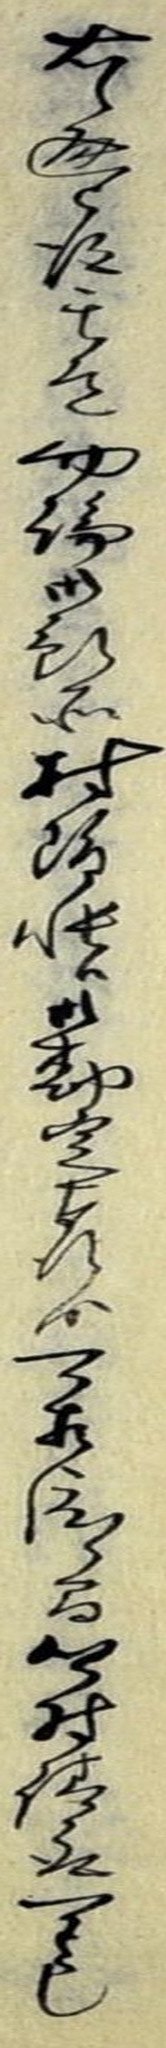右之通被得其意勿論御預所村附帳は御勘定奉行ゟ可相渡候間郷村請取可被申候
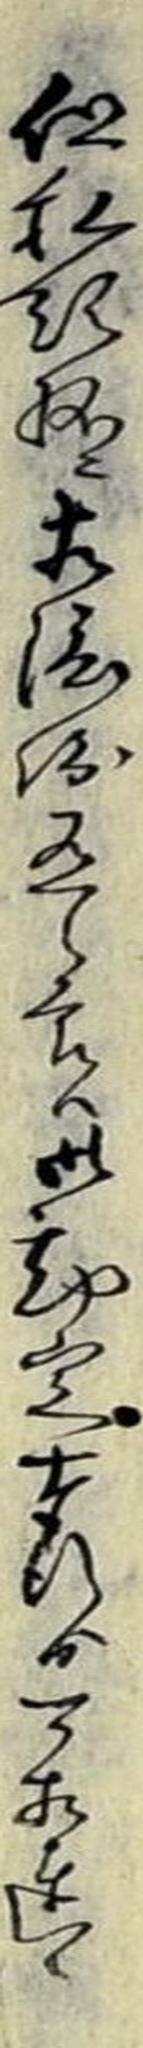但私領抔に相渡儀有之節は御勘定奉行ゟ可相達候
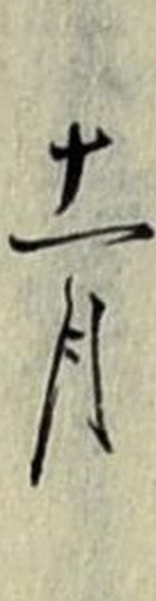十一月
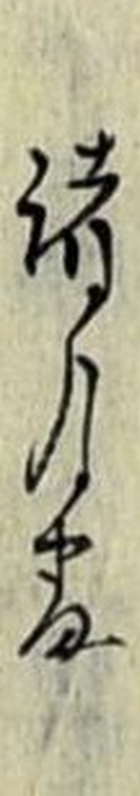諸月番
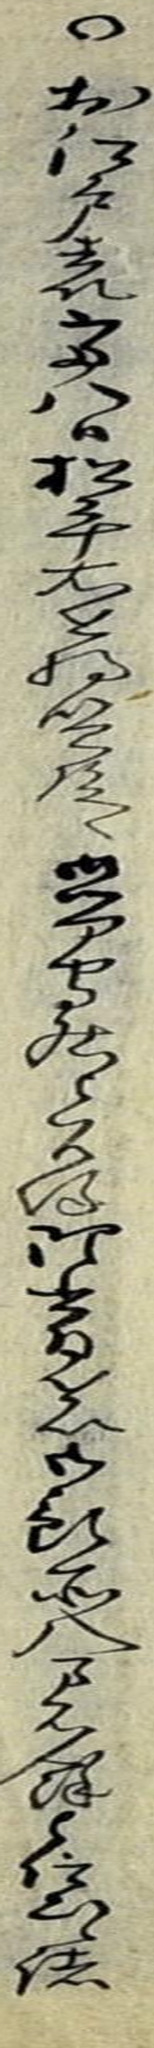〇於江戸表当八日松平右近将監殿へ御留守居被召呼御書付を以御預所八万石余被仰出候諸
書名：命令之部 二
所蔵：福井県文書館 Fukui Prefectural Archives
